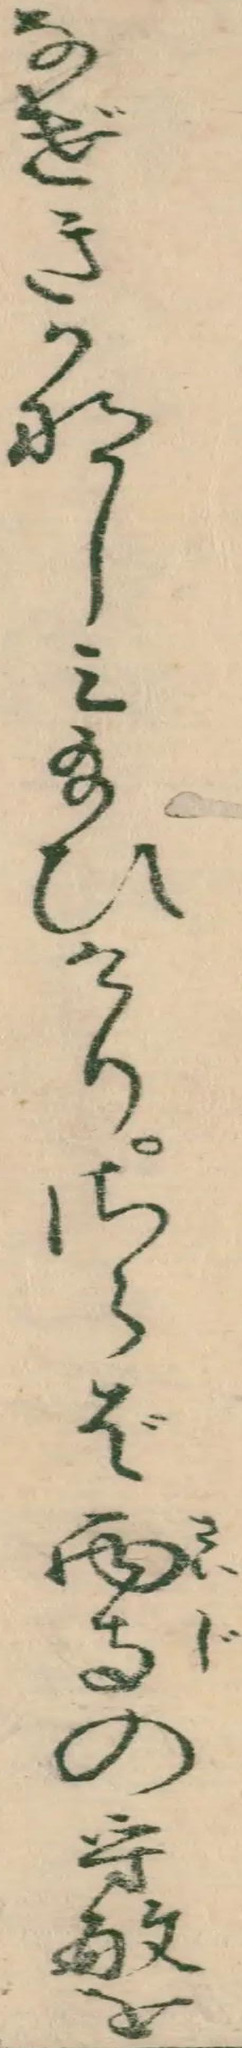なげきかなしみ給ひけり。さらば西寺の守敏を
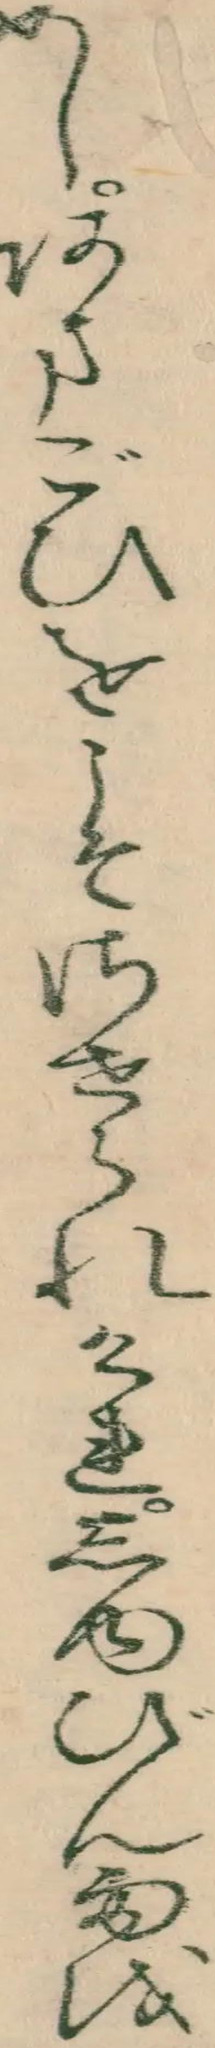めし。あまごひをこそさせられけれ。しゆびん雨を
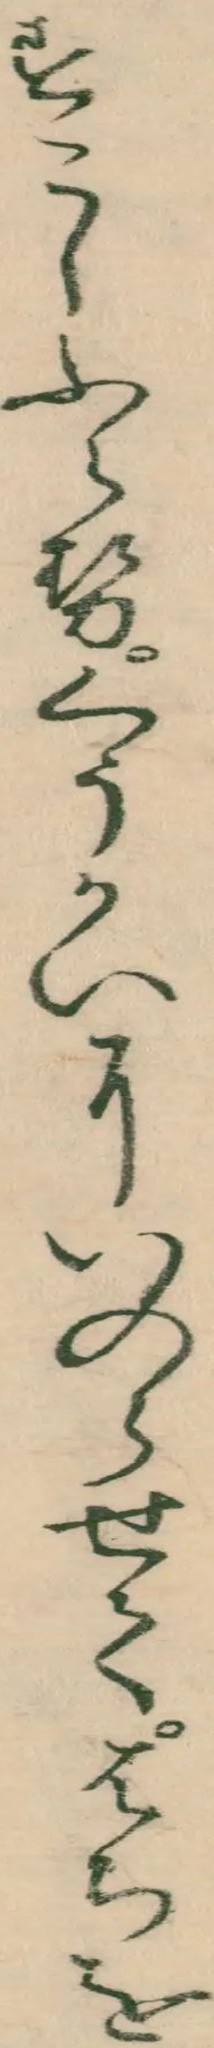すこしふらせ。くうかいにいのらせて。はちを
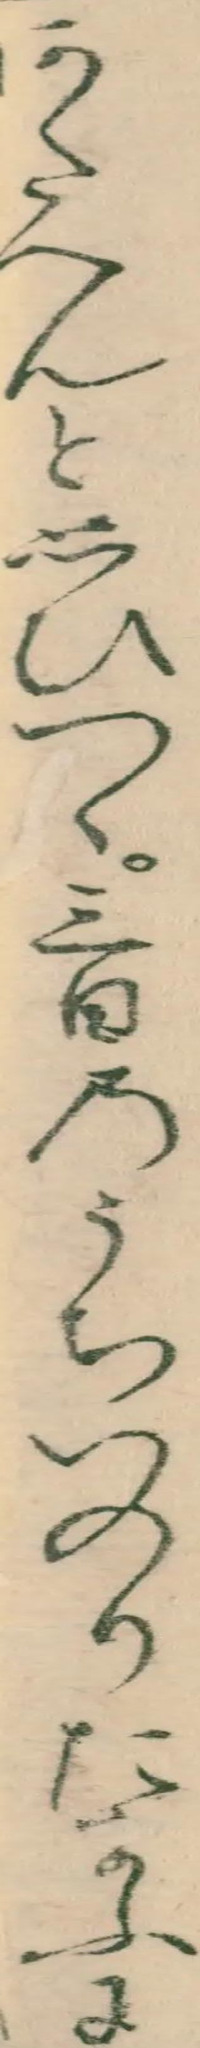あたへんと思ひつゝ。三日のうちいのりたまふに
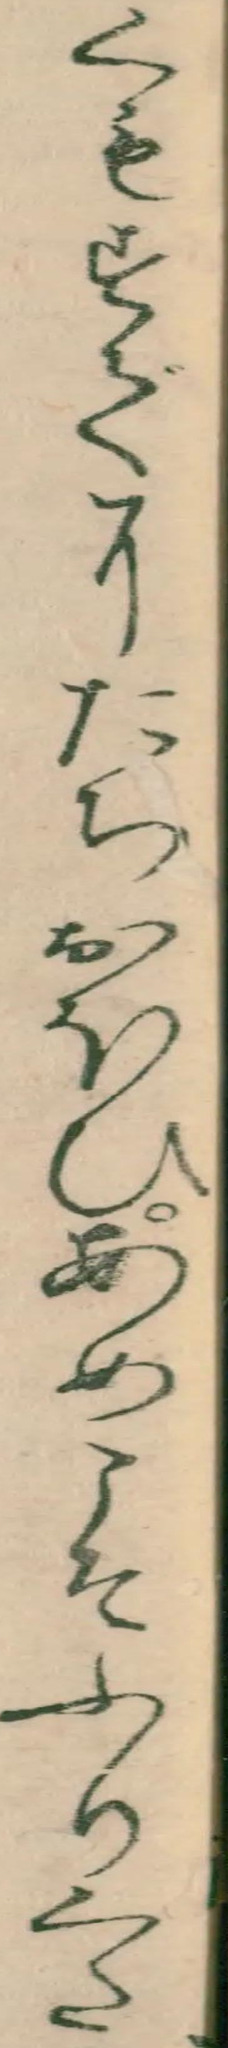くもすでにたちおほひ。あめこそふりくた
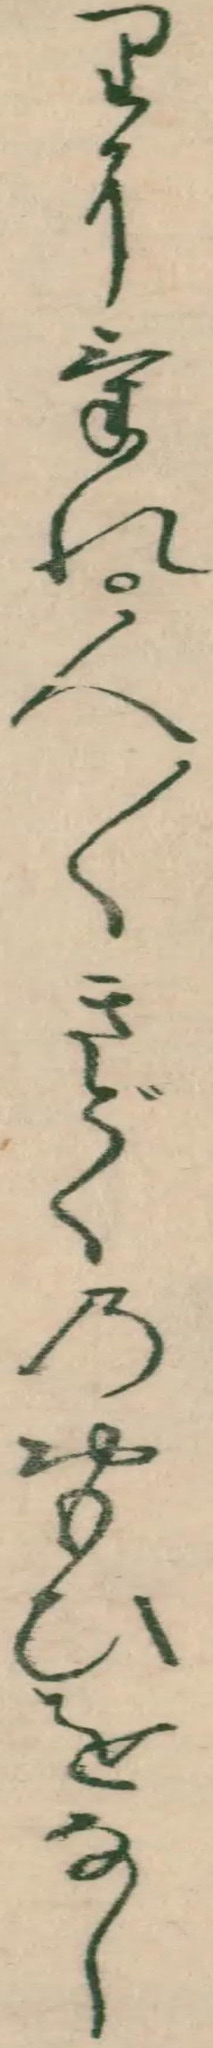りにけれ。人〳〵きどくのおもひをなし
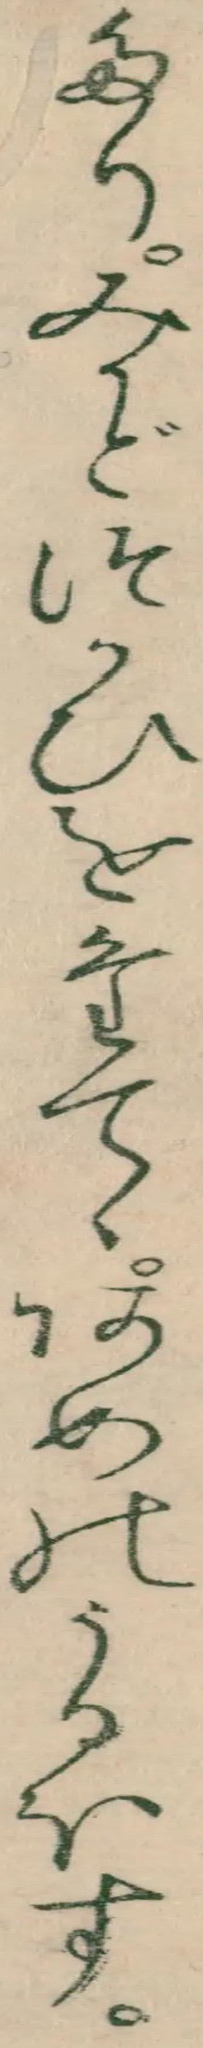たり。みかどつかひをたてゝ。あめのうるほす。
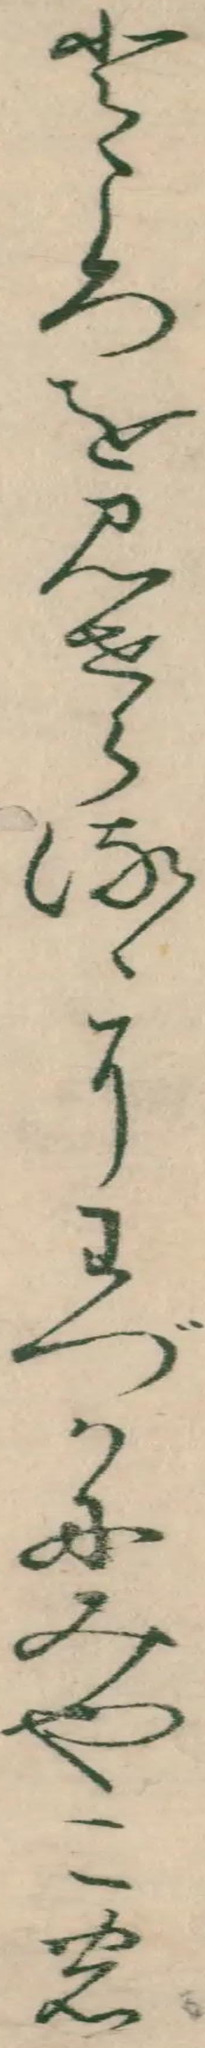ところを見せらるゝにわづかにみやこの
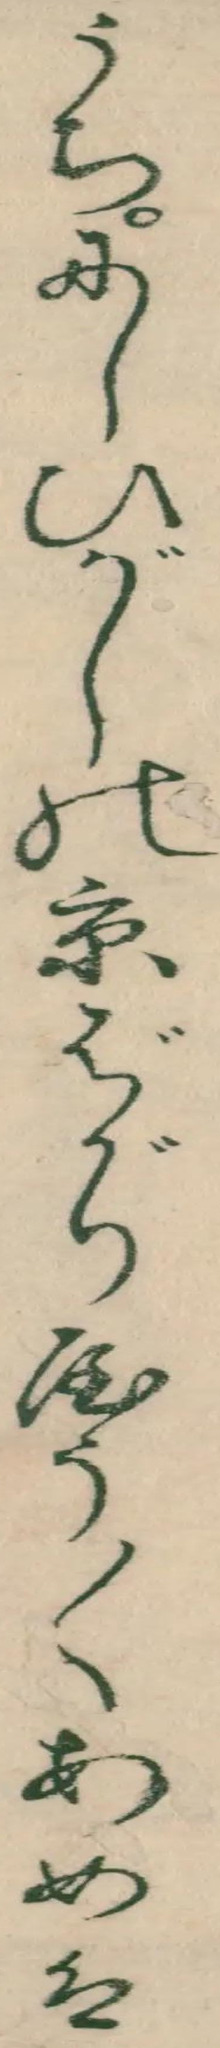うち。にしひがしの京ばがりやう〳〵あめは
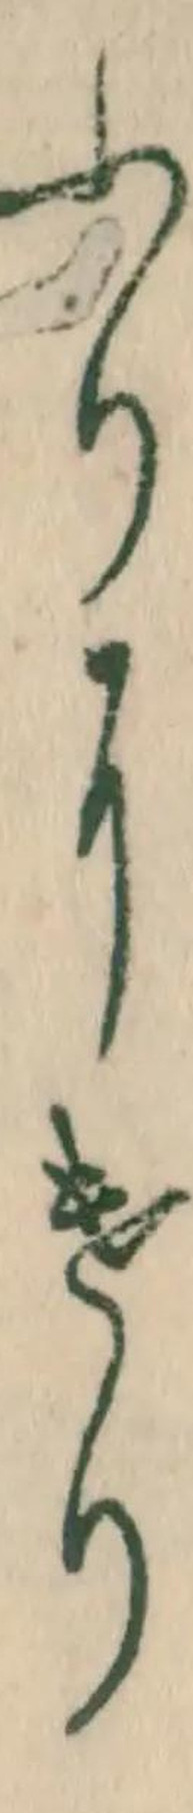ふりにけり

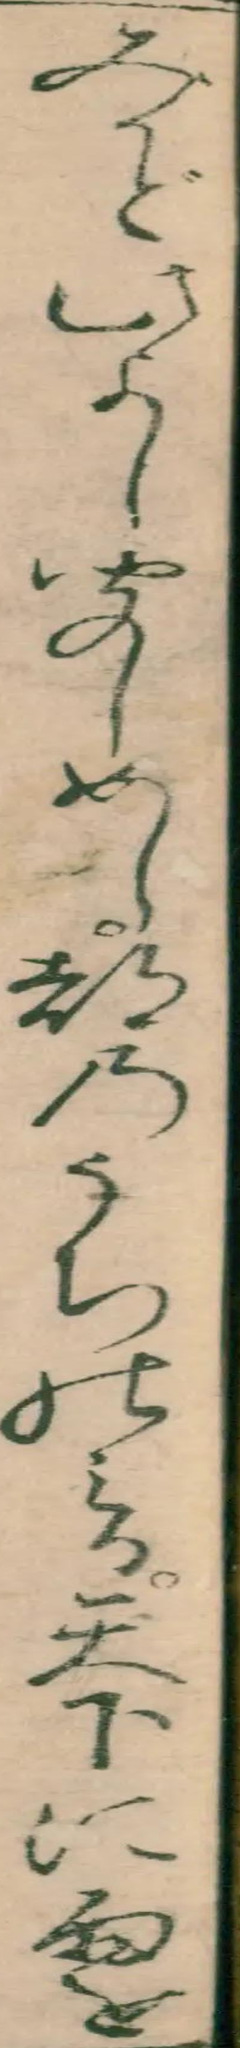みかど此よし聞しめし。都のうちのみか。天下に雨を
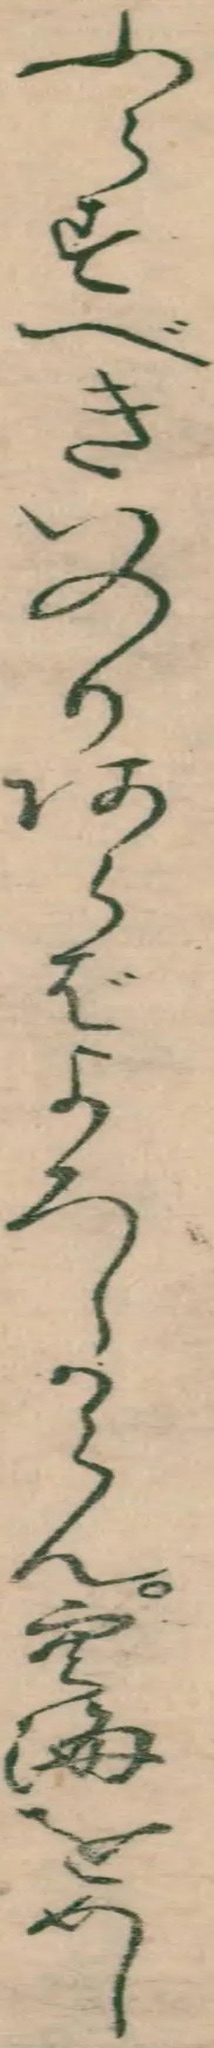ふらすべきいのりあらばよろしからん。空海をめし
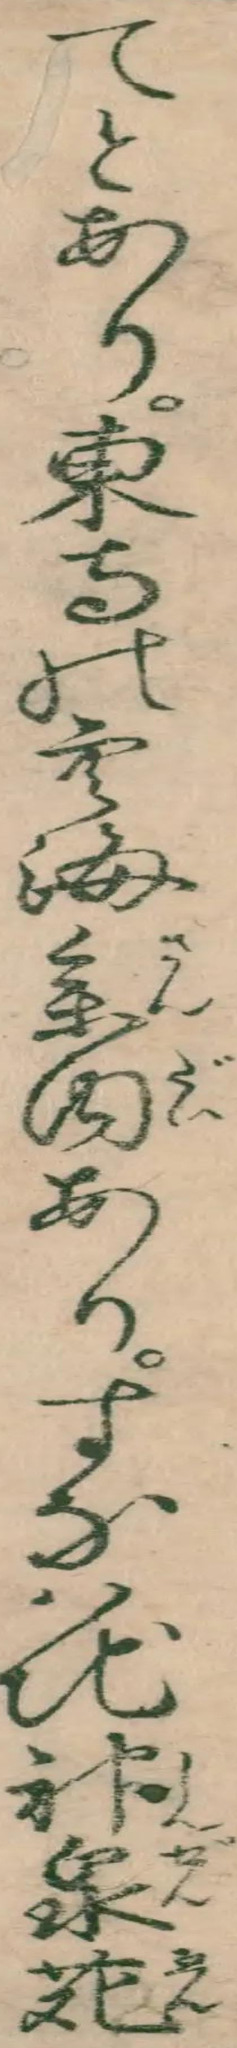てとあり。東寺の空海参内あり。すなはち神泉苑
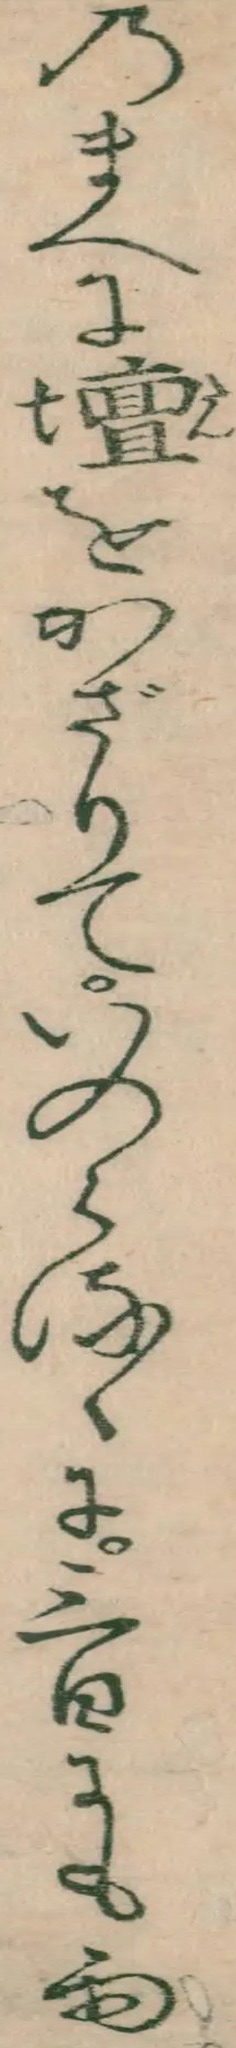のまへに壇をかざりて。いのらるゝに。三日にも雨
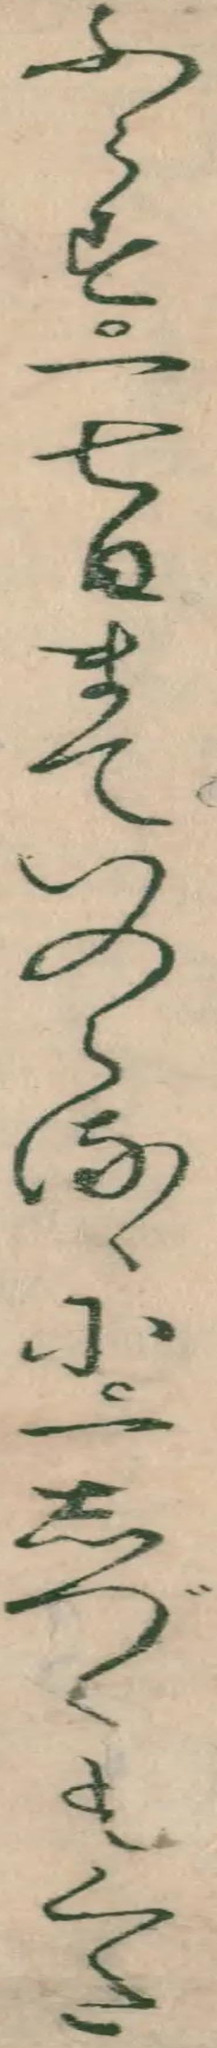ふらす。十七日まていのらるゝに。一しづくもくた
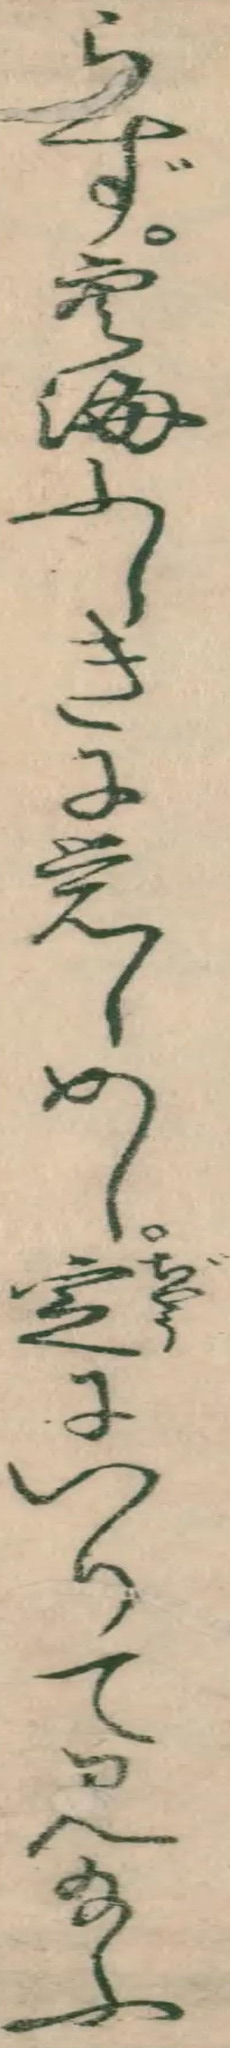らず。空海ふしきに覚しめし。定にいりて見給ふ
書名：弘法大師御本地 3巻. [2]
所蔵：国立国会図書館 National Diet Library, JAPAN
